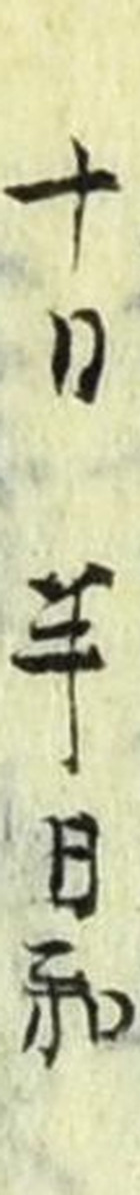十日半日和
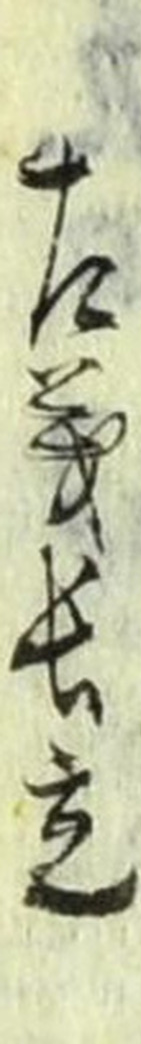左義長立
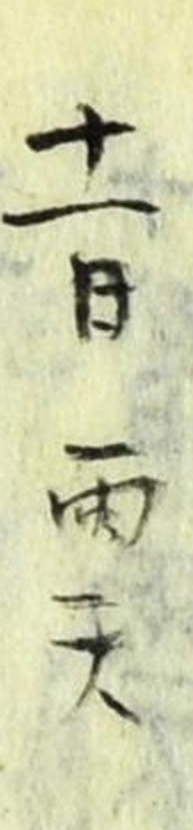十一日雨天
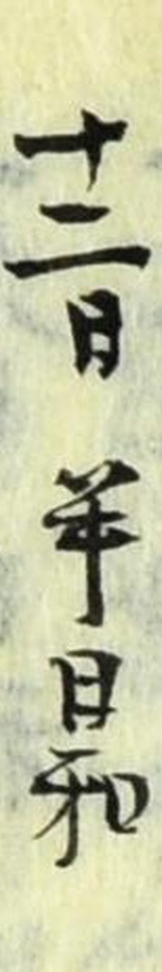十二日半日和
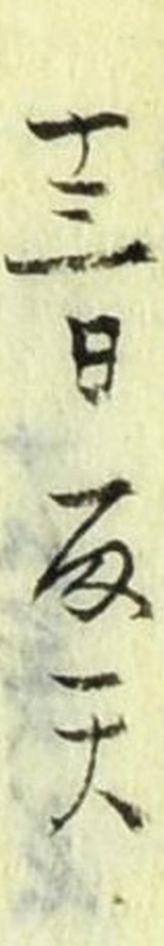十三日雨天
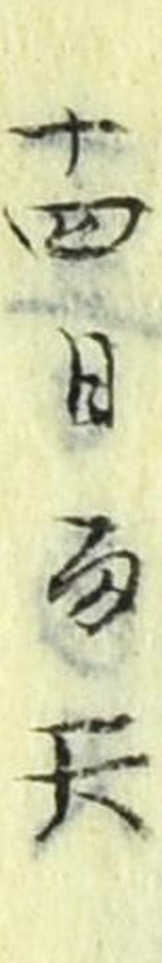十四日雨天

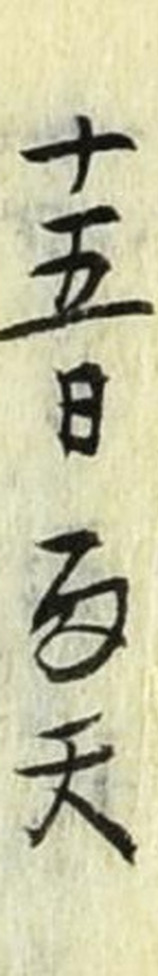十五日雨天
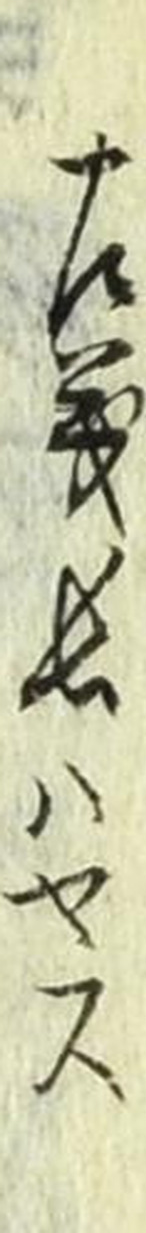左義長ハヤス
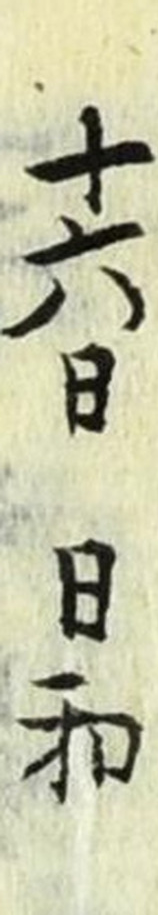十六日日和
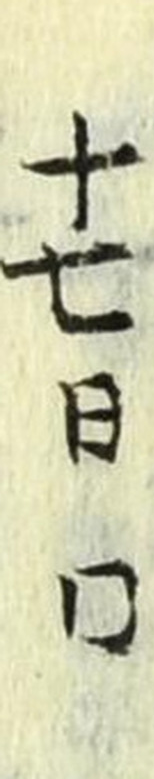十七日同
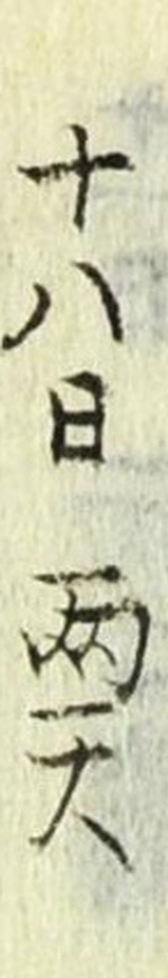十八日雨天
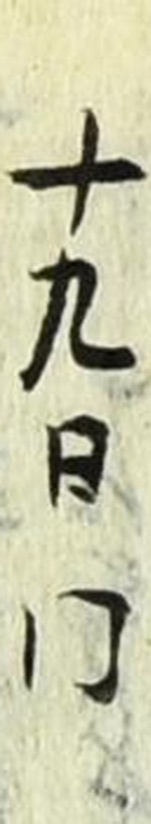十九日同
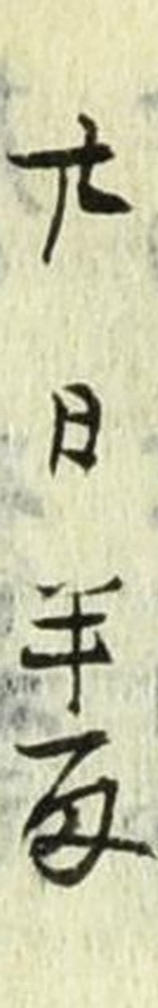廿日半雨
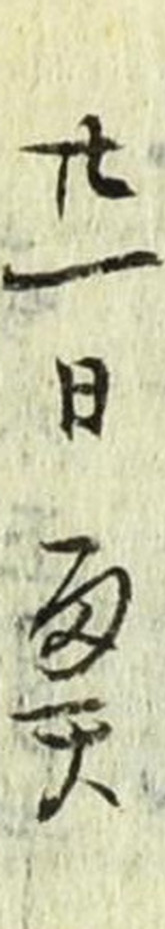廿一日雨天
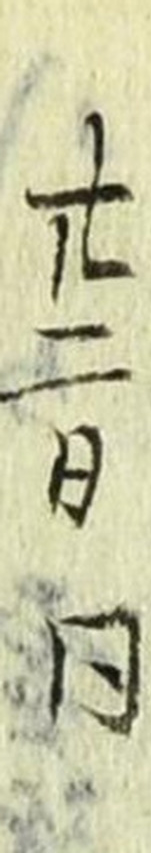廿二日同
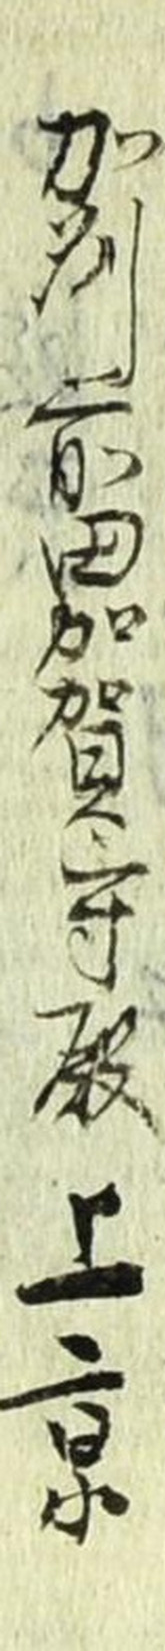加州前田加賀守殿上京
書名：（日記）
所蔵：福井県文書館 Fukui Prefectural Archives
